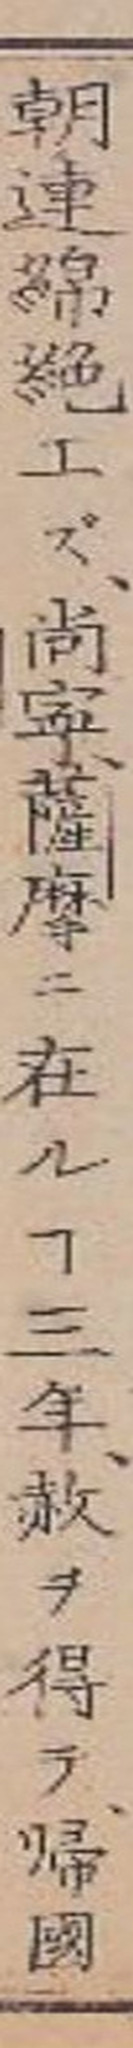朝連綿絶エズ、尚寧薩摩ニ在ルヿ三年、赦ヲ得テ、帰国
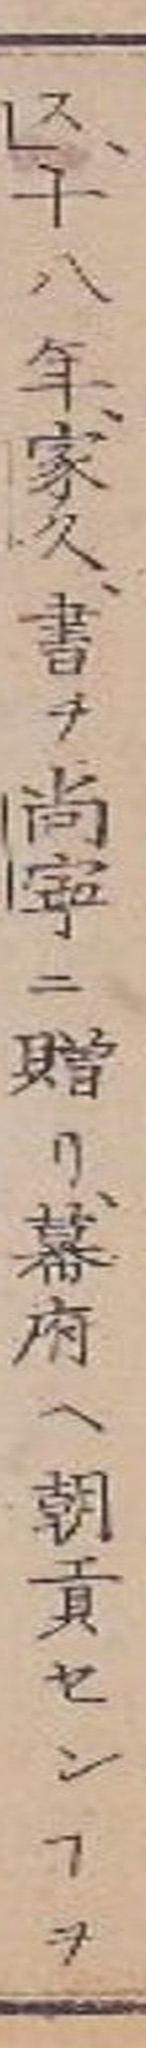ス、」十八年、家久、書ヲ尚寧ニ贈リ、幕府ヘ朝貢センヿヲ
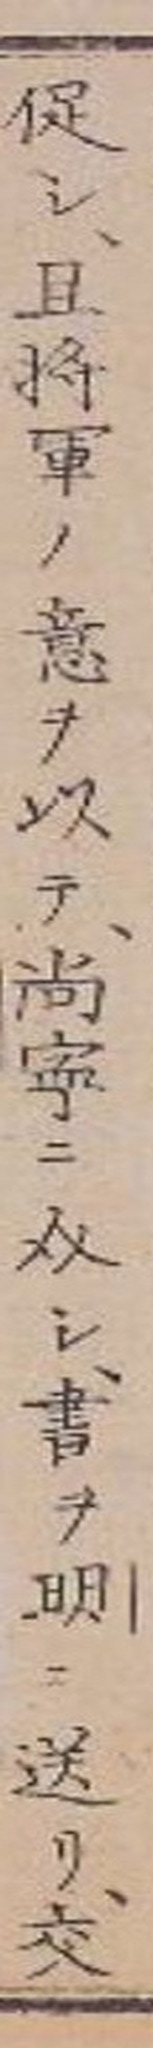促シ、且将軍ノ意ヲ以テ、尚寧ニ介シ、書ヲ明ニ送リ、交
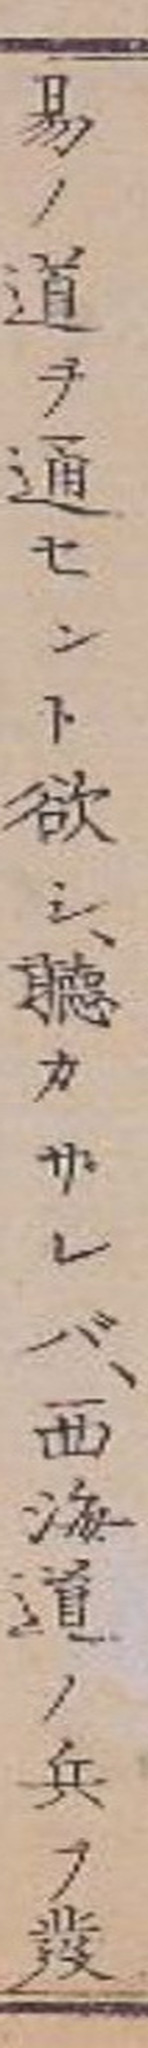易ノ道ヲ通セント欲シ、聴カザレバ、西海道ノ兵ヲ発
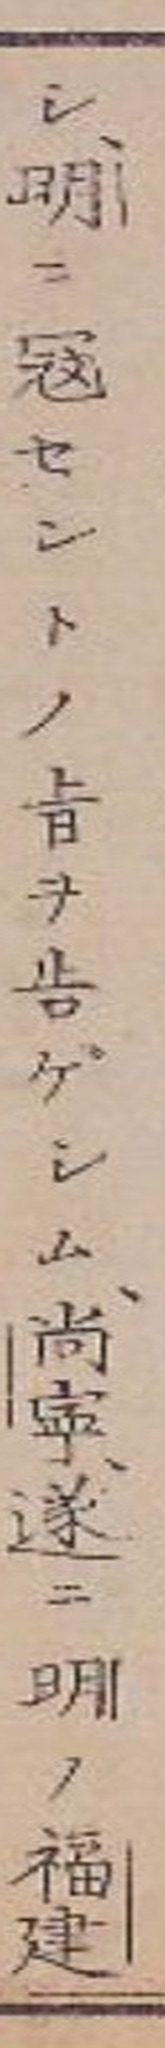シ、明ニ寇セントノ旨ヲ告ゲシム、尚寧、遂ニ明ノ福建
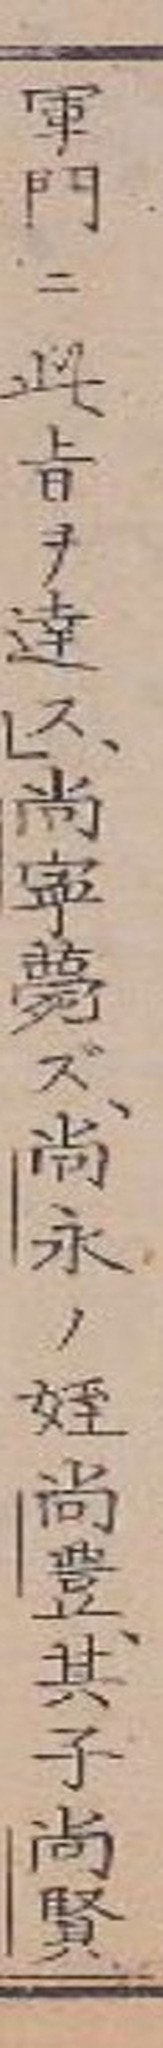軍門ニ此旨ヲ達ス、」尚寧薨ズ、尚永ノ姪尚豊、其子尚賢
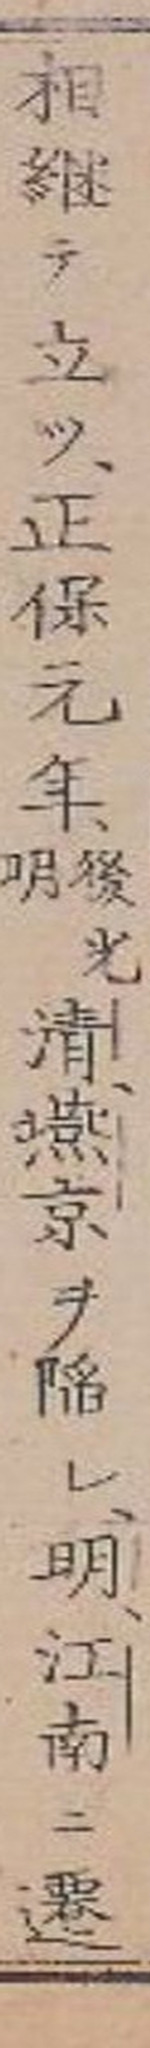相継テ立ツ、正保元年、後光明清、燕京ヲ陥レ、明、江南ニ遷
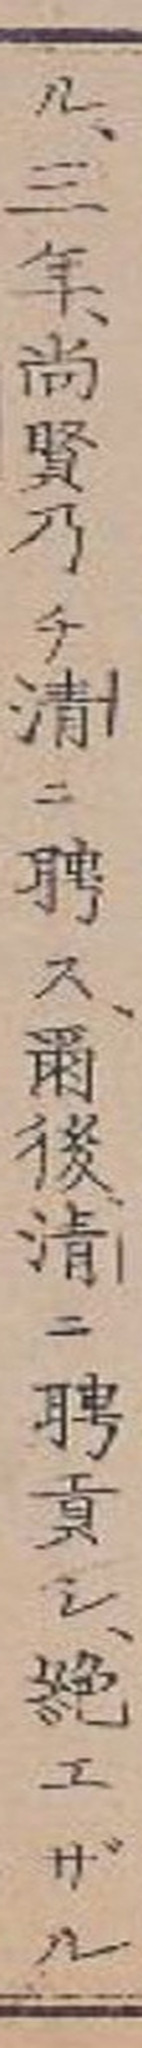ル、三年、尚賢乃チ清ニ聘ス、爾後、清ニ聘貢シ、絶エザル
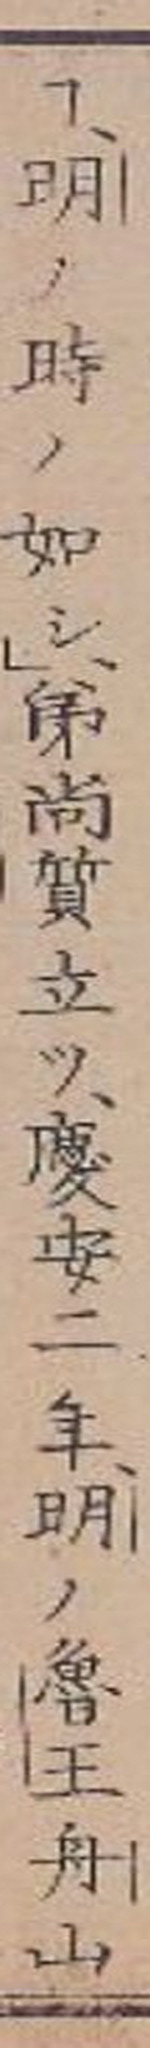ヿ、明ノ時ノ如シ、」弟尚質立ツ、慶安二年、明ノ魯王舟山
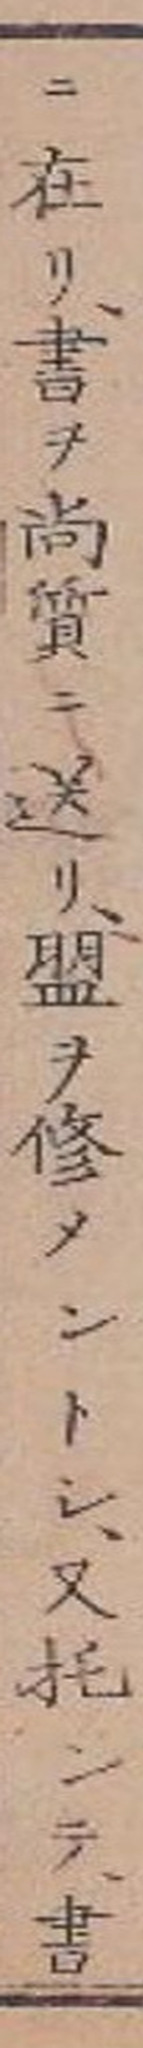ニ在リ、書ヲ尚質ニ送リ、盟ヲ修メントシ、又托ンテ、書

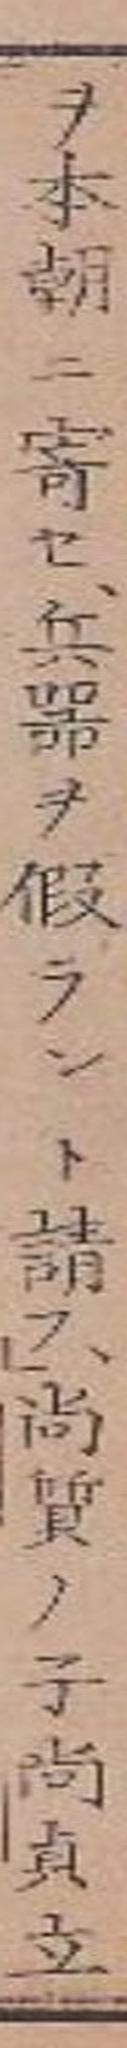ヲ本朝ニ寄セ、兵器ヲ仮ラント請フ、」尚質ノ子尚貞立
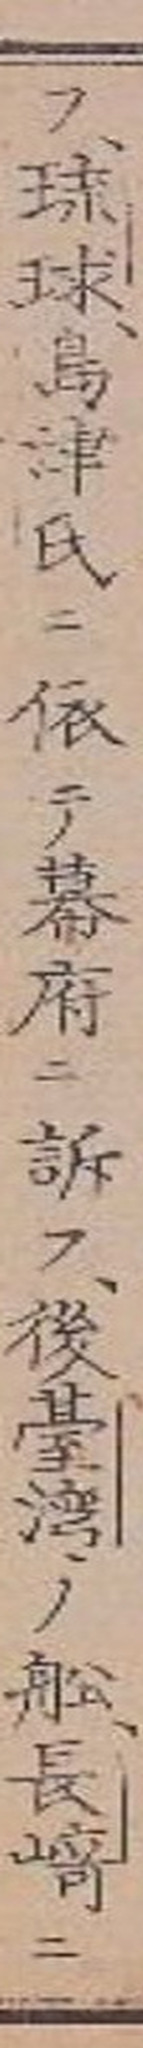フ、琉球、島津氏ニ依テ幕府ニ訴フ、後台湾ノ船、長崎ニ
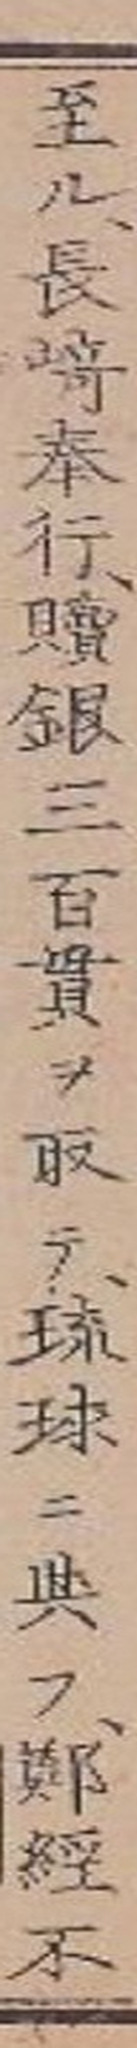至ル、長崎奉行、贖銀三百貫ヲ取テ、琉球ニ与フ、鄭経不
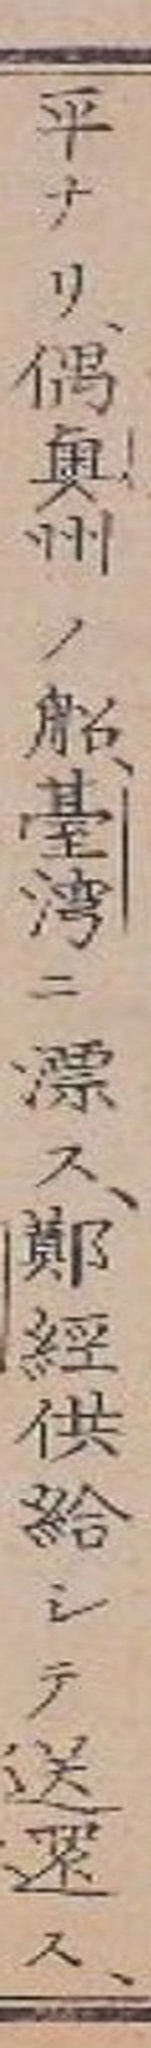平ナリ、偶奥州ノ船、台湾ニ漂ス、鄭経供給シテ送還ス、
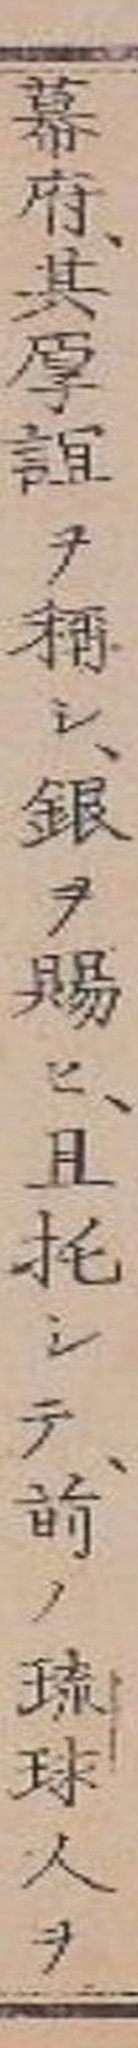幕府、其厚誼ヲ称シ、銀ヲ賜ヒ、且托シテ、前ノ琉球人ヲ
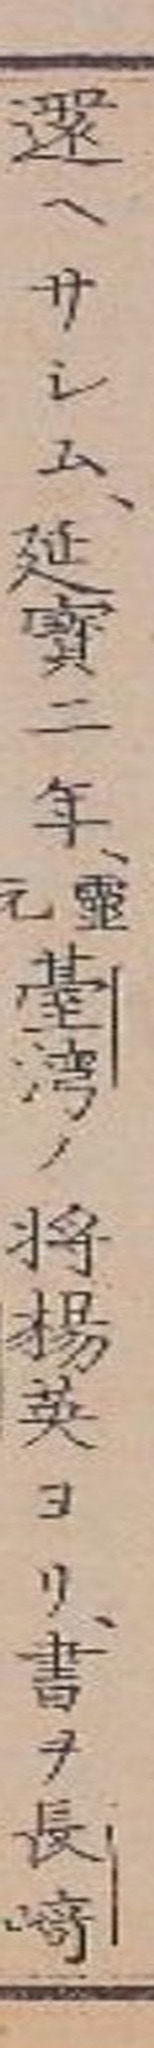還ヘサシム、延宝二年、霊元台湾ノ将楊英ヨリ、書ヲ長崎
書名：琉球新誌 巻上
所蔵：University of the Ryukyus Library
